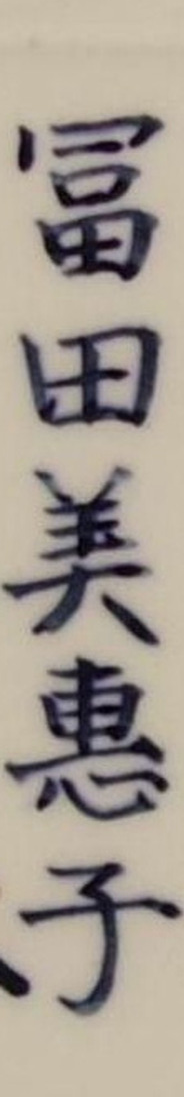冨田美恵子
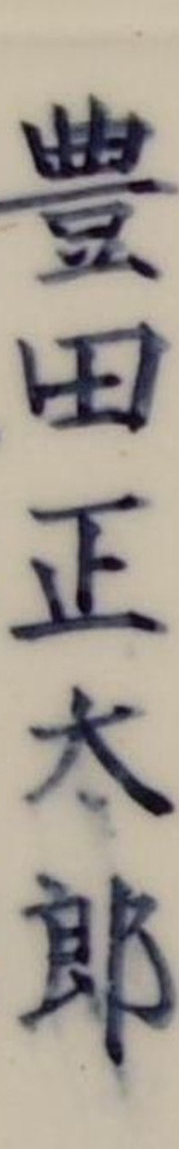豊田正太郎
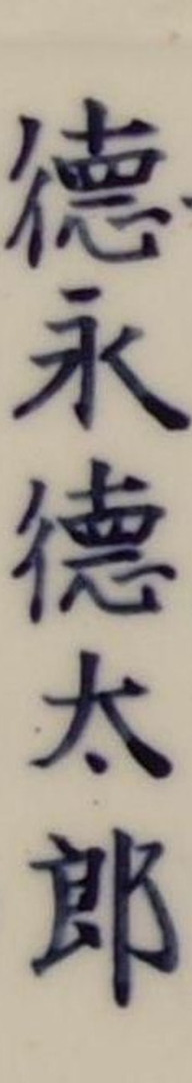徳永徳太郎
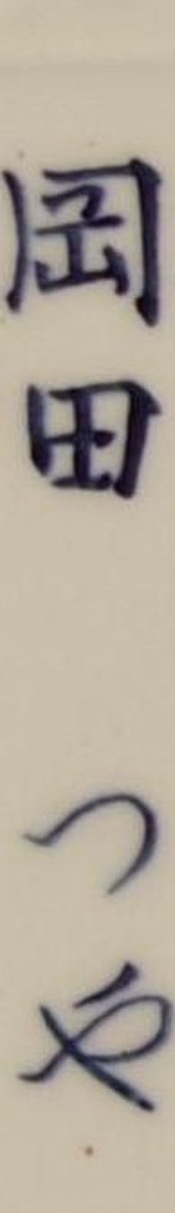岡田つや
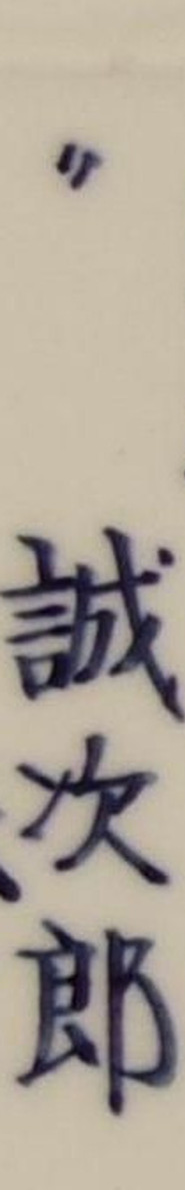誠次郎
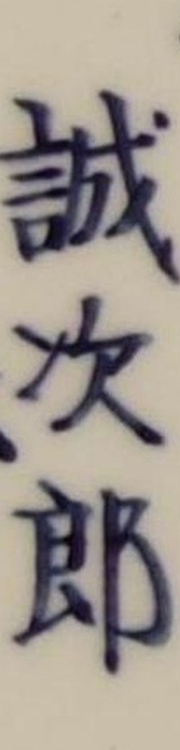誠次郎

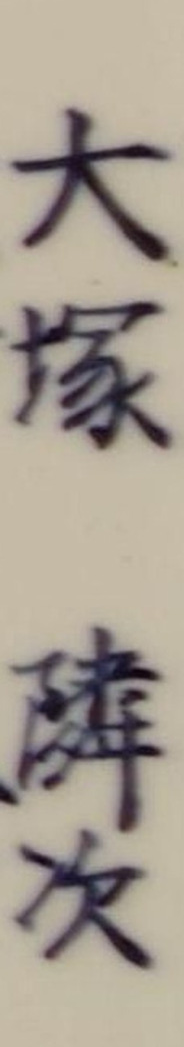大塚隣次
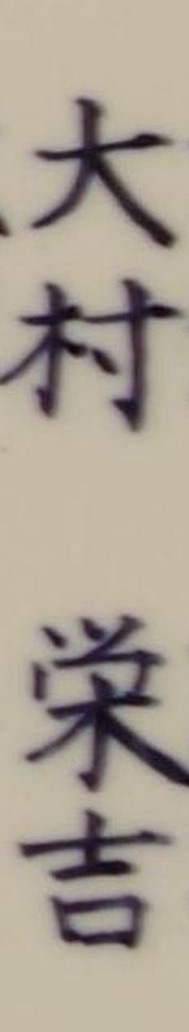大村栄吉
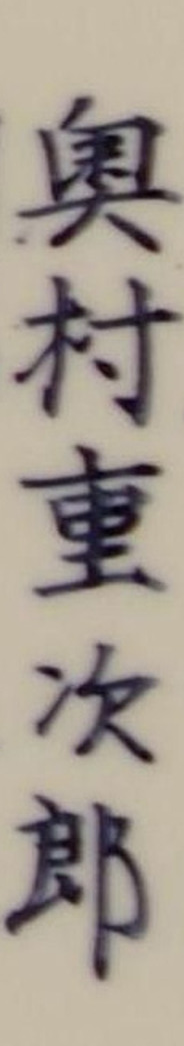奥村重次郎
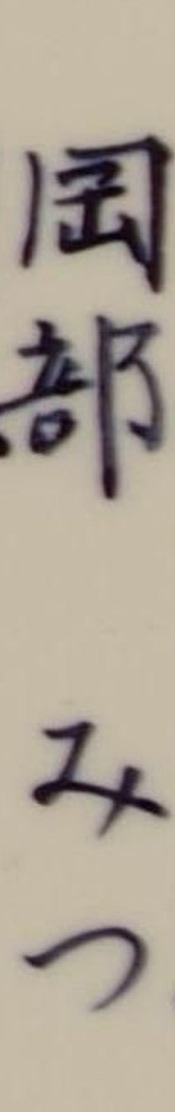岡部みつ
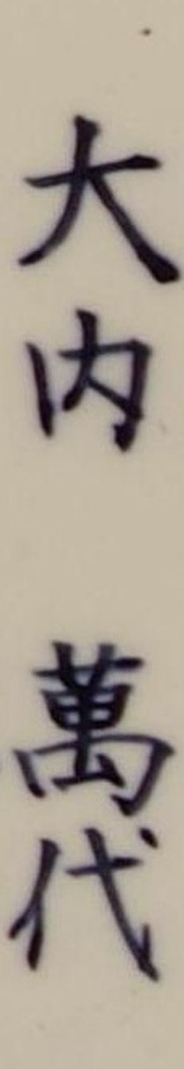大内萬代
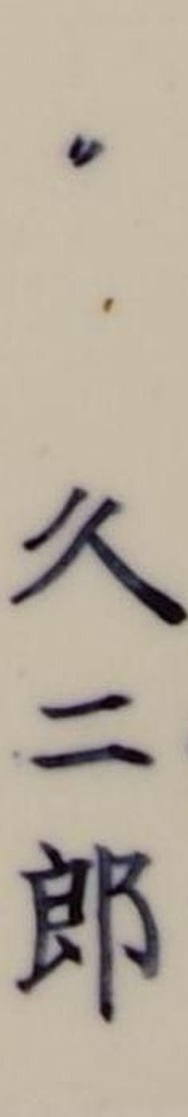久二郎
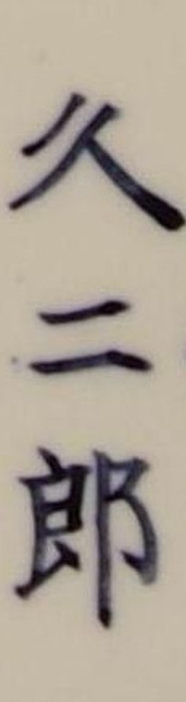久二郎
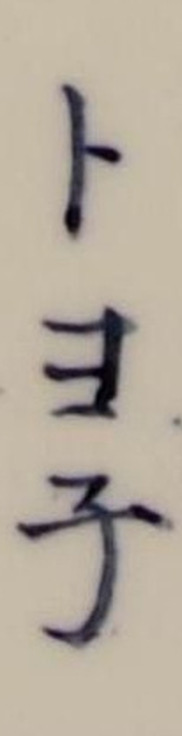トヨ子
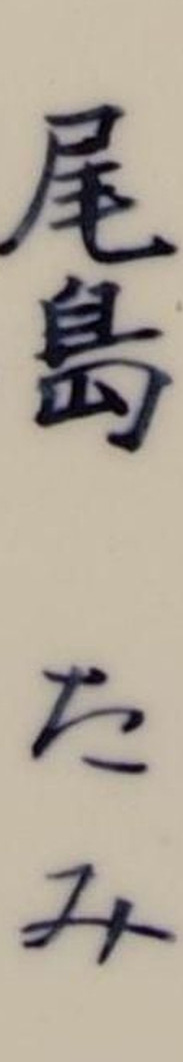尾島たみ
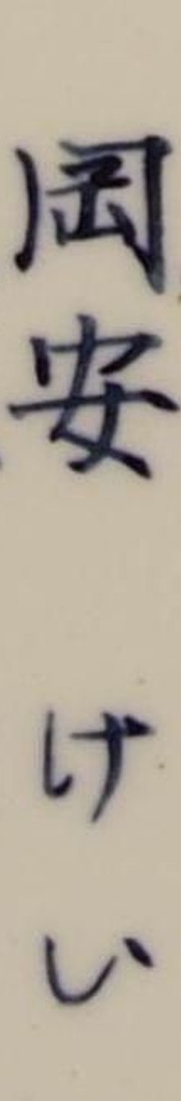岡安けい
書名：E~L
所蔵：高野山金剛峯寺
